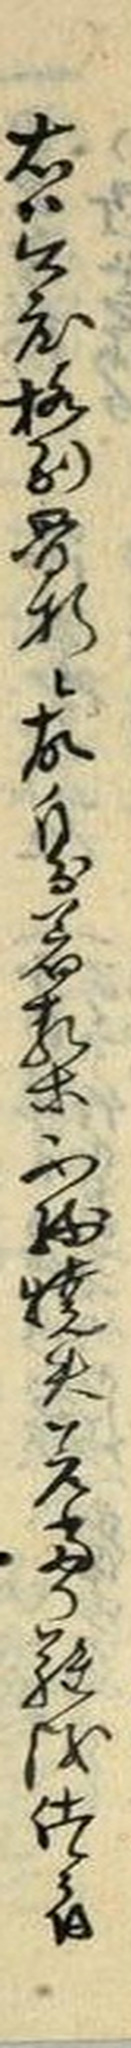右ハ今度格別骨折候故自分着類等不残焼失差当り難儀仕候ニ付
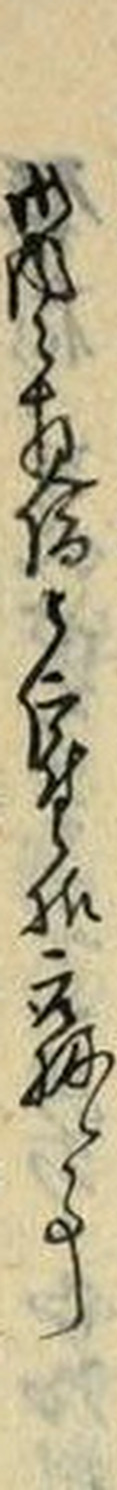御内々拝借被仰付候様取扱候事

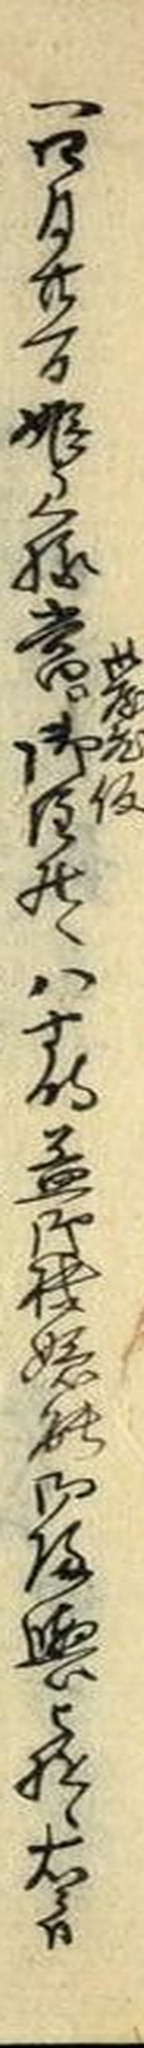一四月廿一日姫君様当御屋敷仮御住居へ八半時益御機嫌能御帰輿被遊候右ニ付
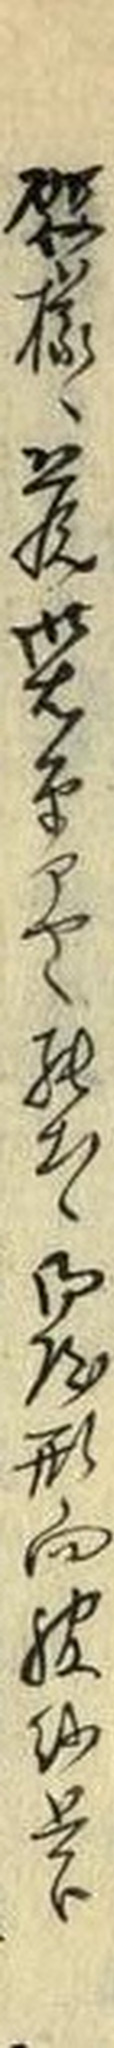殿様へ恐悦御右筆部やへ罷出候御屋形向服紗上下
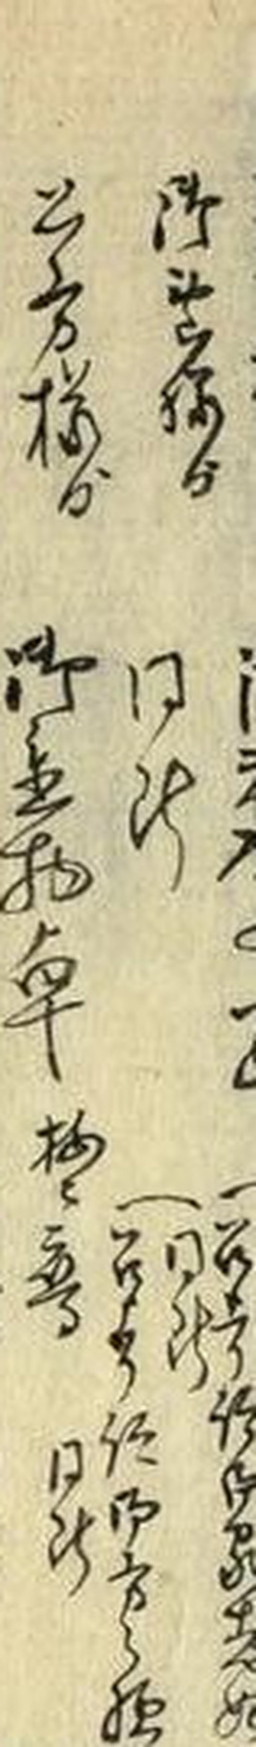公方様ゟ御置物卓梅ニ鶯同断
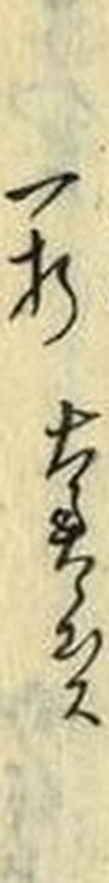鯛一折大奥へ出ス
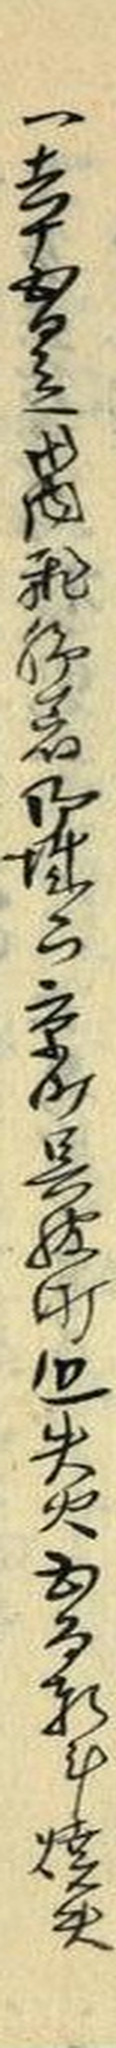一去十五日立御内飛脚着御城下京町呉服町辺失火五百軒斗焼失
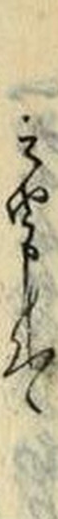之由申来候
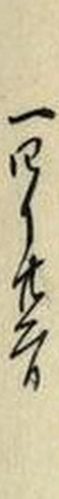一四月廿五日
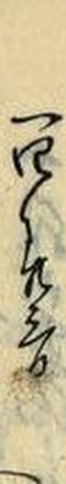一四月廿五日
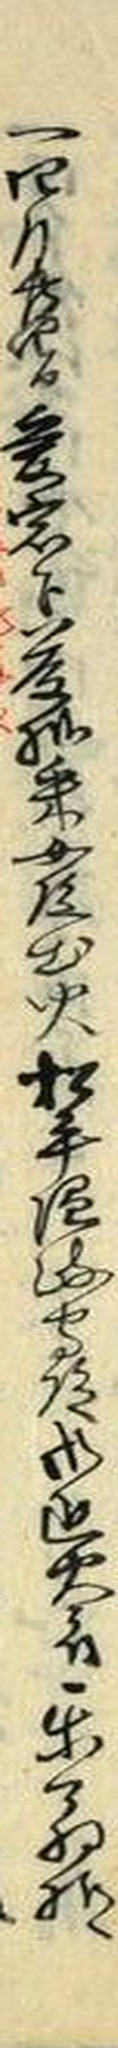一四月廿四日愛宕下藤掛采女殿出火松平隠岐守殿御近火ニ付楽翁様へ
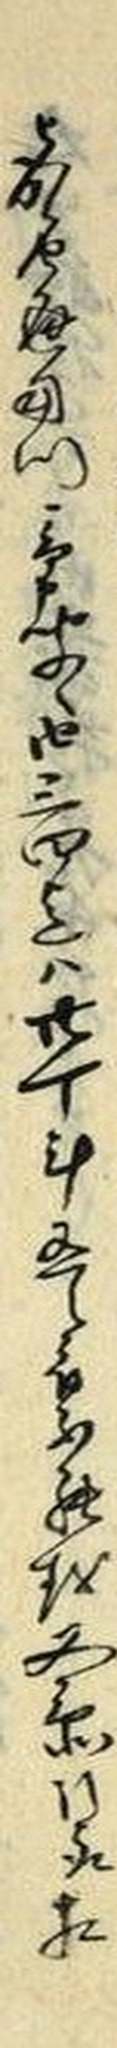被成候由通用門ニ而聞候由三田迄ハ廿丁斗有之候付不罷越又兵衛引取相
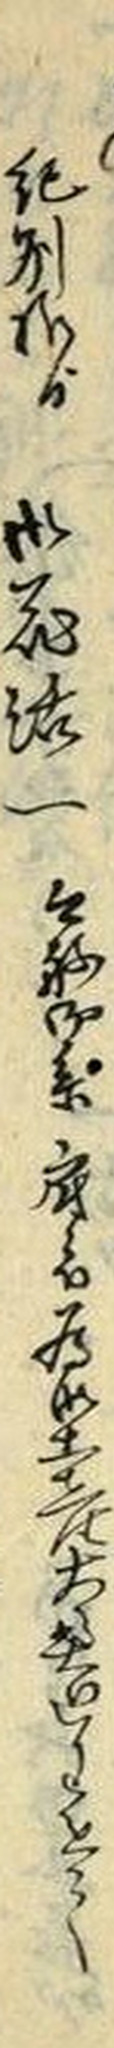紀州様ゟ御花活一今般御参府ニ付為御土産大奥廻り被進之
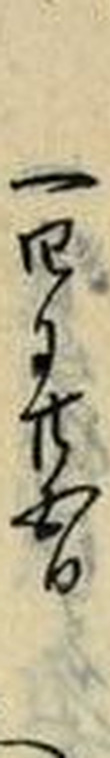一四月廿五日

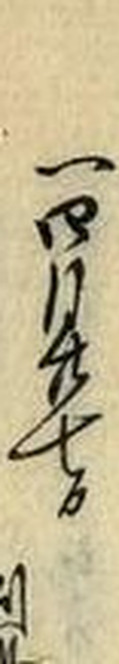一四月廿七日
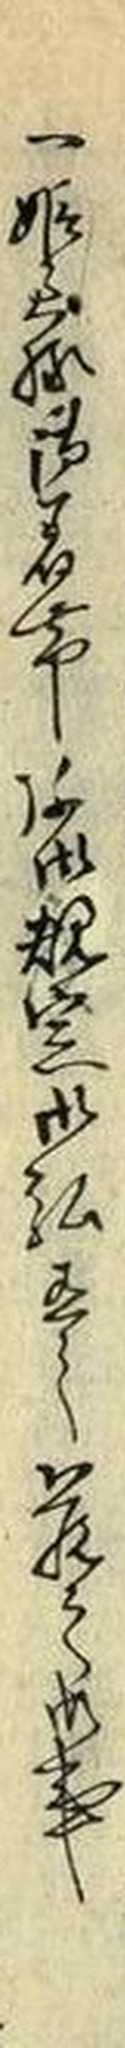一姫君様御着帯弥御規定御弘有之恐悦之御事
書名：少傅日録抄（斉承付側向頭取日記、在府）
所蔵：福井県文書館 Fukui Prefectural Archives
